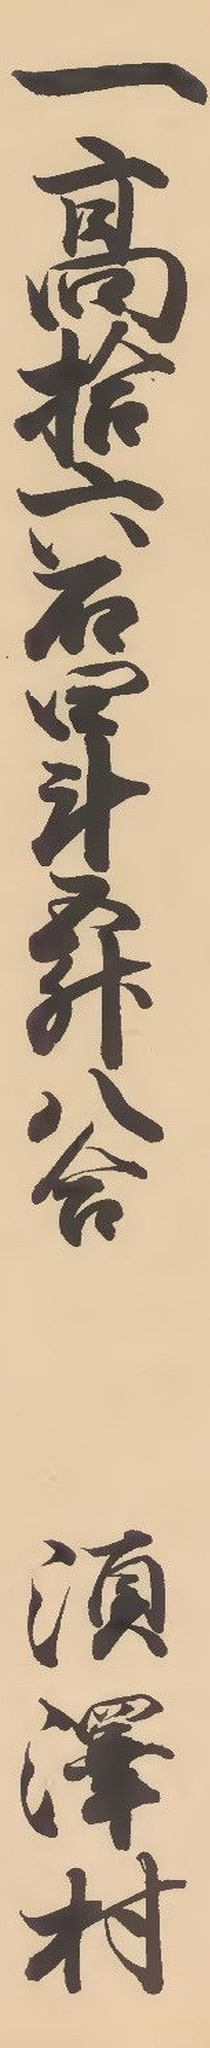一高拾六石四斗五升八合須沢村
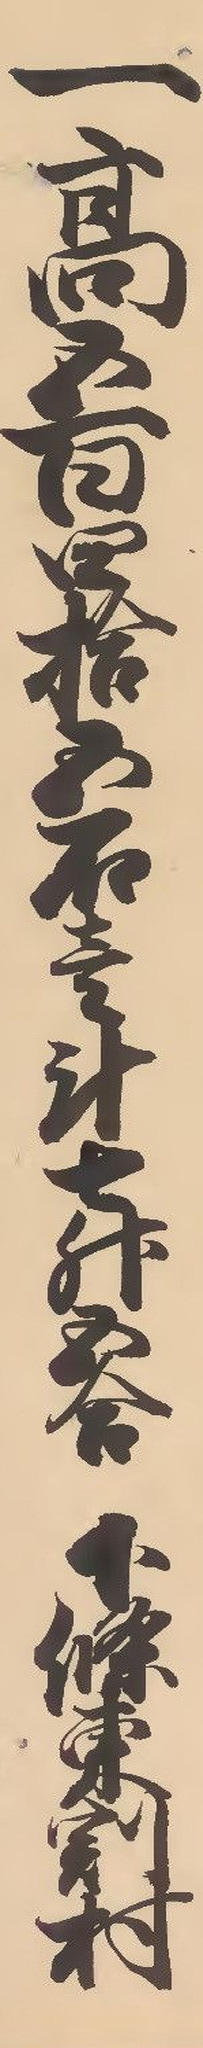一高五百四拾五石壱斗七升五合下条東割村
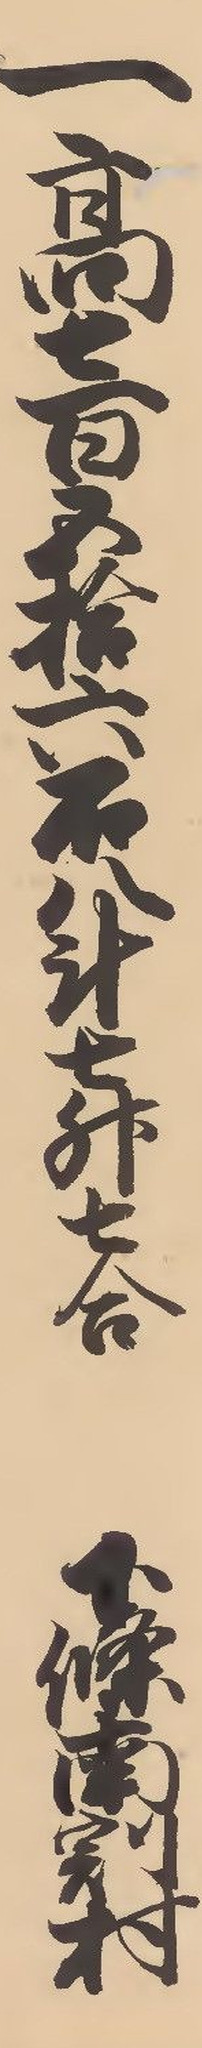一高七百五拾六石八斗七升七合下条南割村
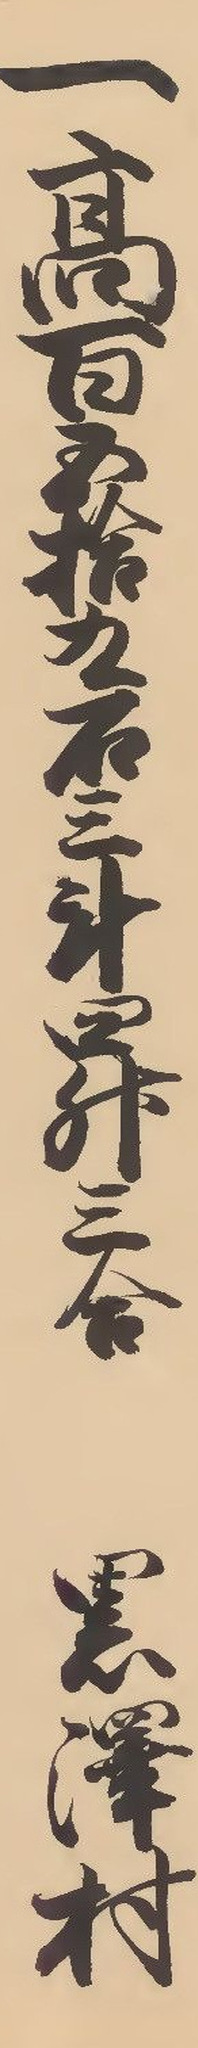一高百五拾九石三斗四升三合黒沢村
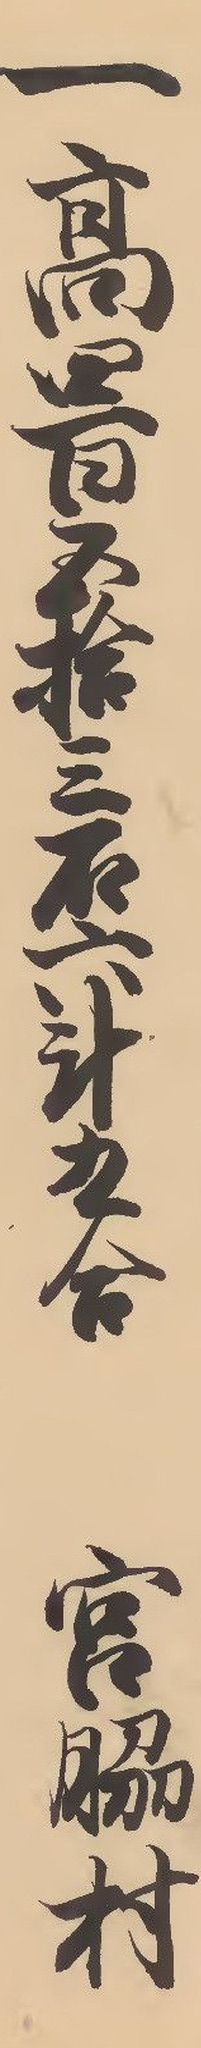一高四百五拾三石六斗九合宮脇村
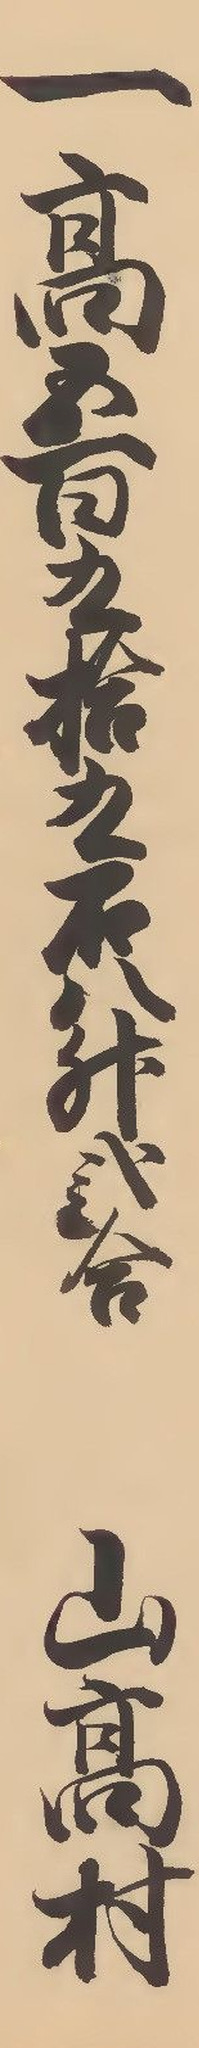一高五百九拾九石八升弐合山高村

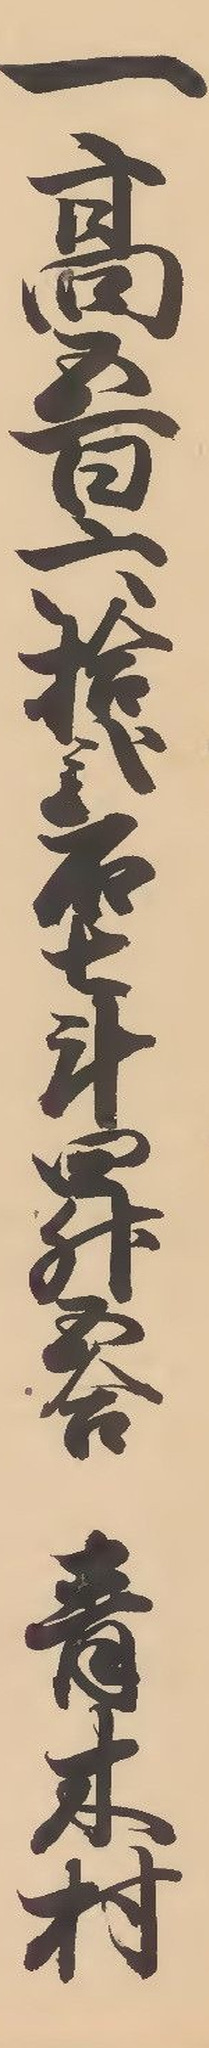一高五百六拾弐石七斗四升五合青木村
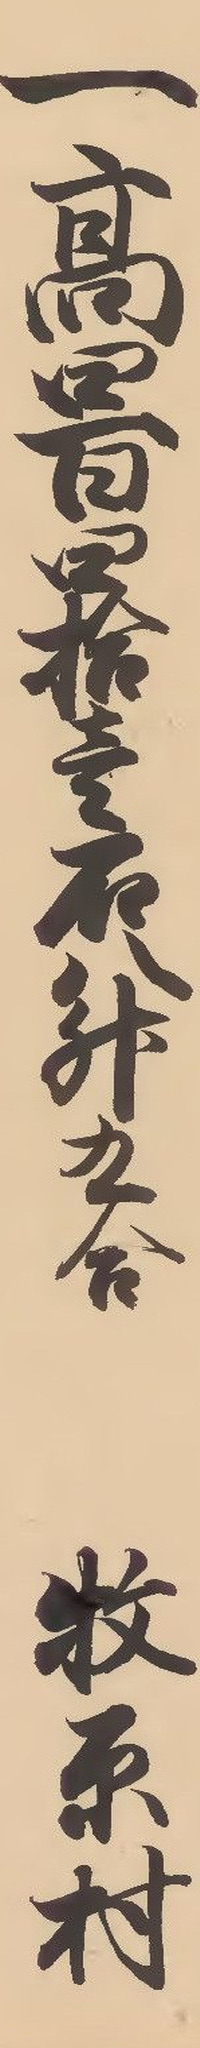一高四百四拾壱石八升九合牧原村
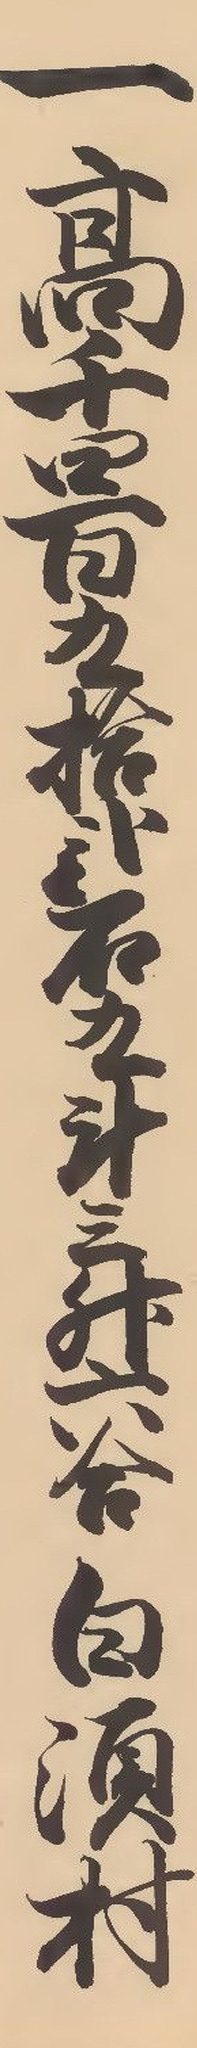一高千四百九拾弐石九斗三升六合白須村
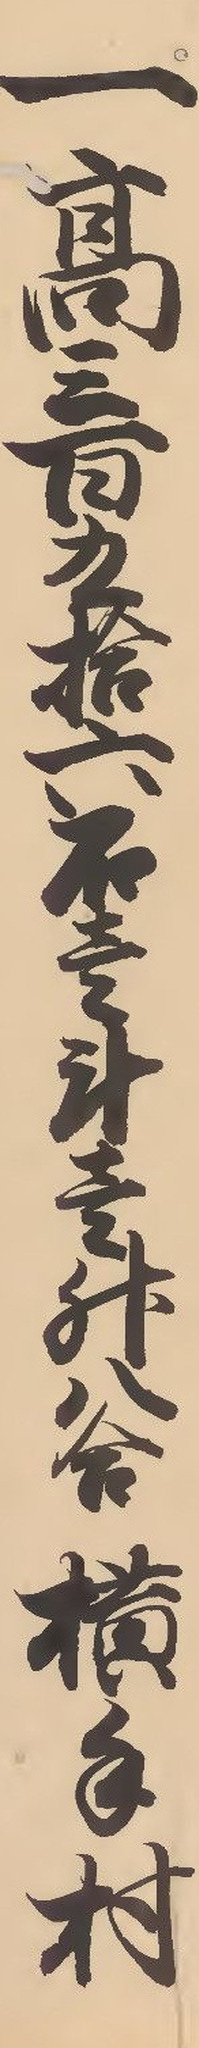一高三百九拾六石壱斗壱升八合横手村
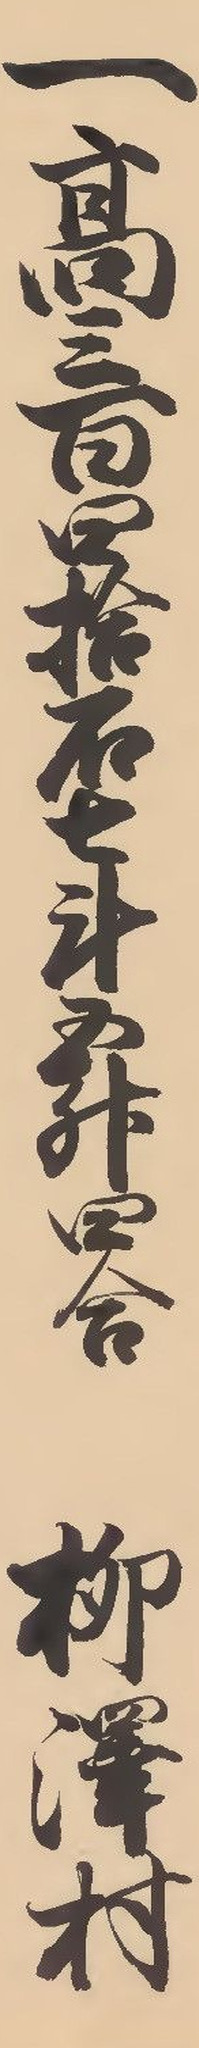一高三百四拾石七斗五升四合柳沢村
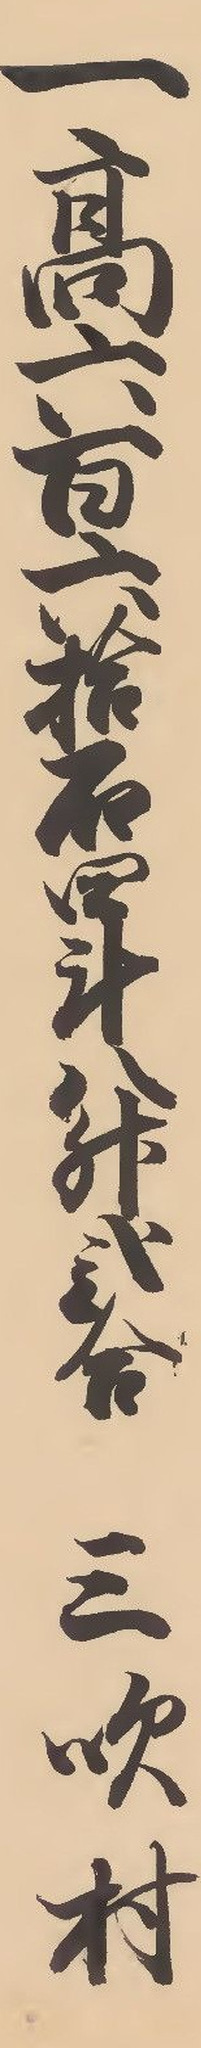一高六百六拾石四斗八升弐合三吹村
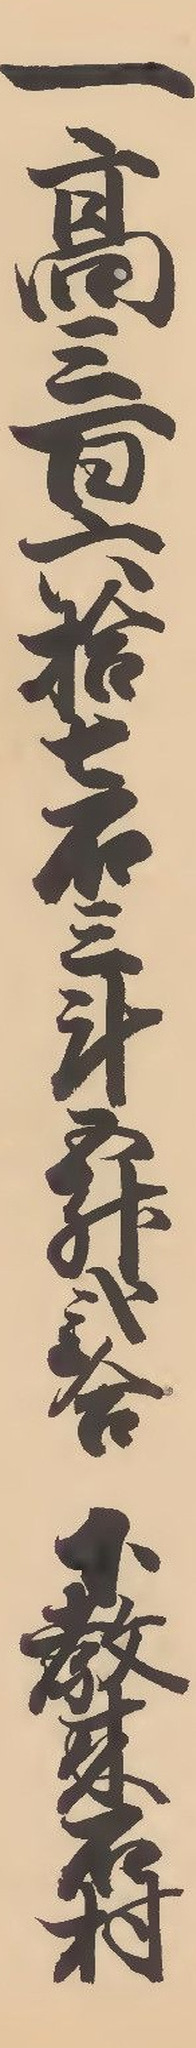一高三百六拾七石三斗五升弐合下教来石村

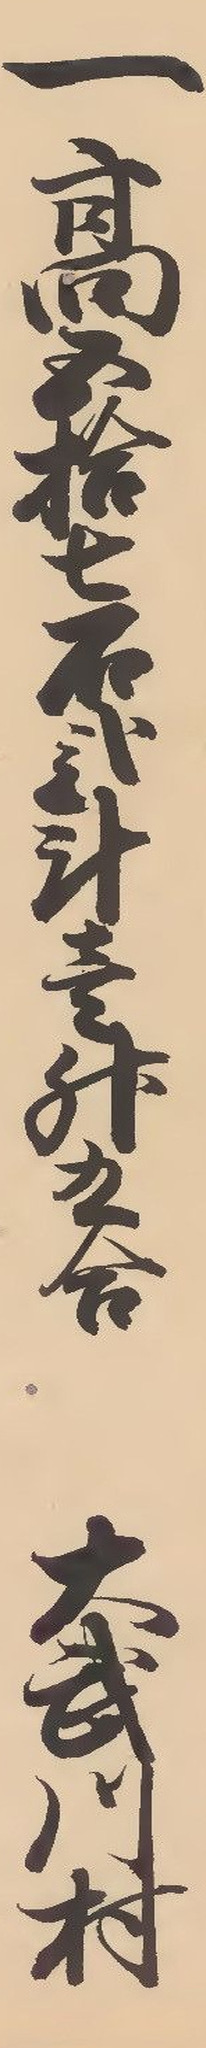一高五拾七石弐斗壱升九合大武川村
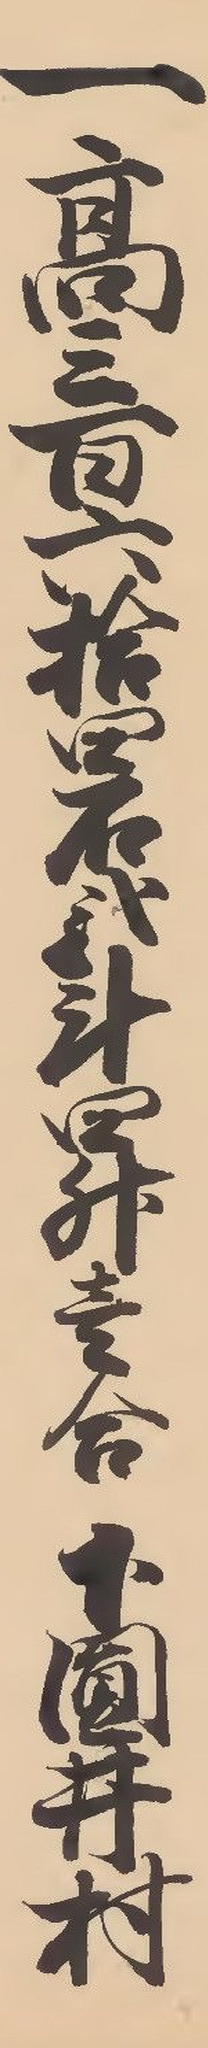一高三百六拾四石弐斗四升壱合下円井村
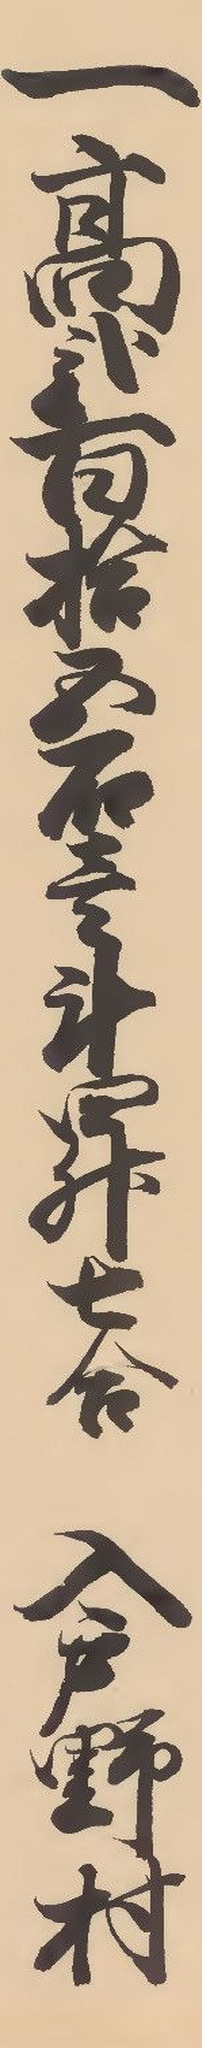一高弐百拾五石壱斗四升七合入戸野村
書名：甲斐国郷帳
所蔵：国立公文書館 National Archives of Japan
